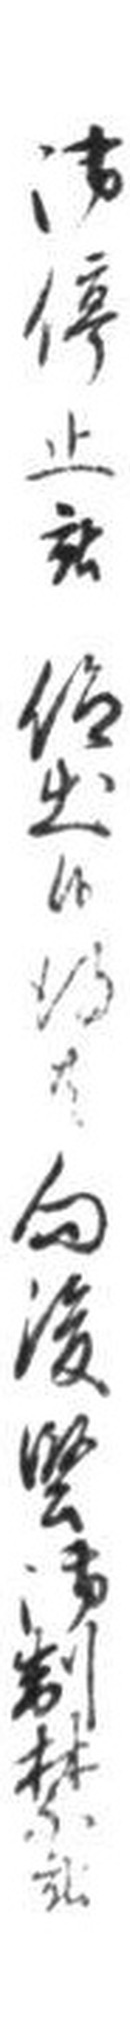御停止被仰出候得共向後堅御制禁被
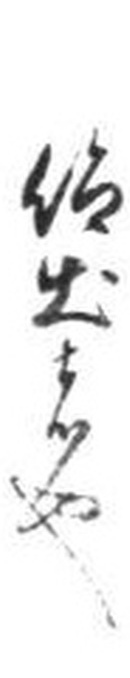仰出者也
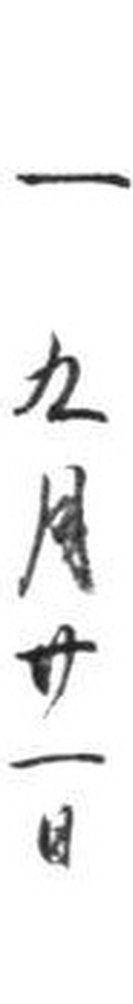一九月廿一日
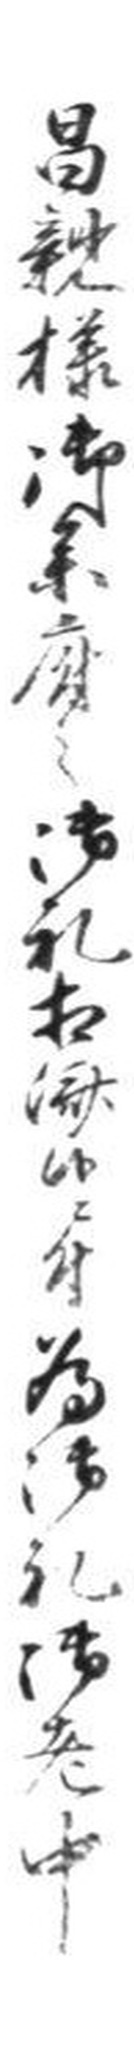昌親様御参府之御礼相済候ニ付為御礼御老中
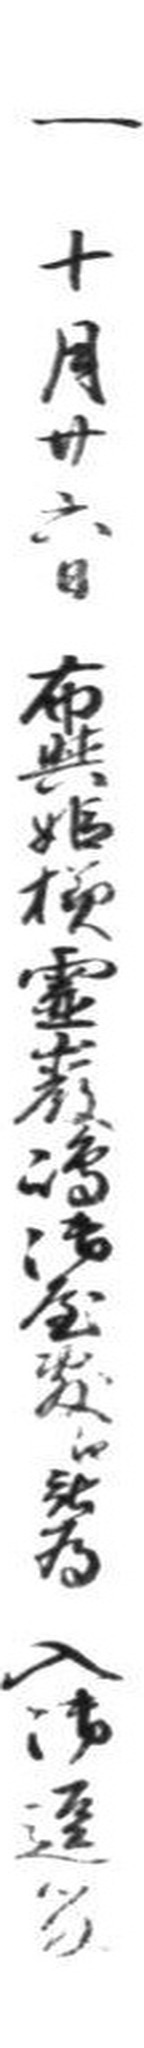一十月廿六日布与姫様霊巌嶋御屋敷江被為入御逗留
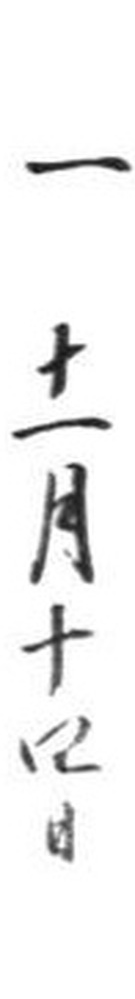一十一月十四日
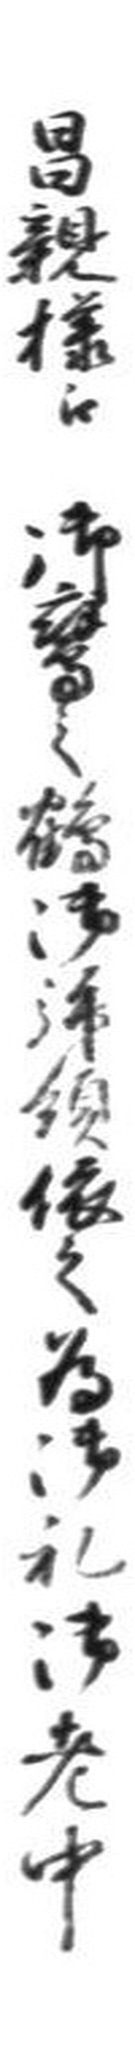昌親様江御鷹之鶴御拝領依之為御礼御老中
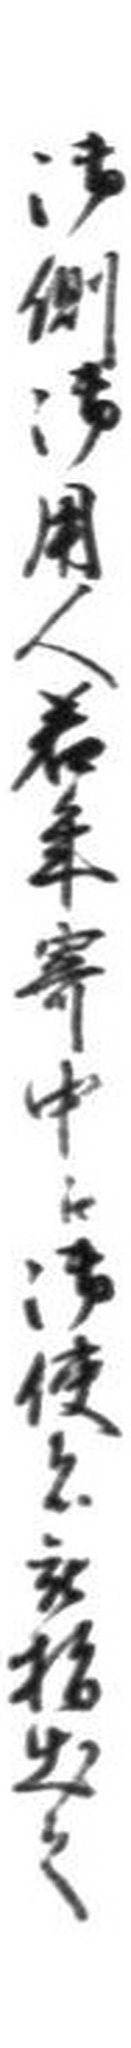御側御用人若年寄中江御使者被指出之
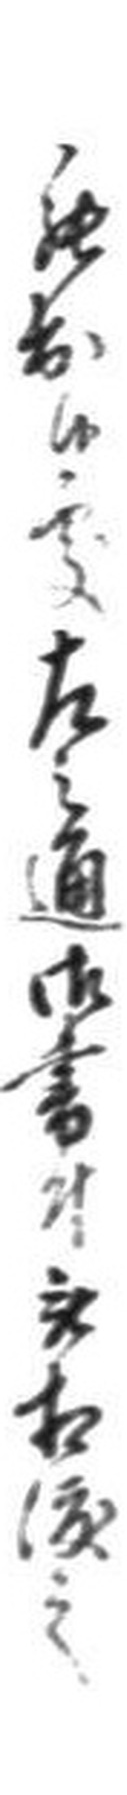罷出候処左之通御書付被相渡之
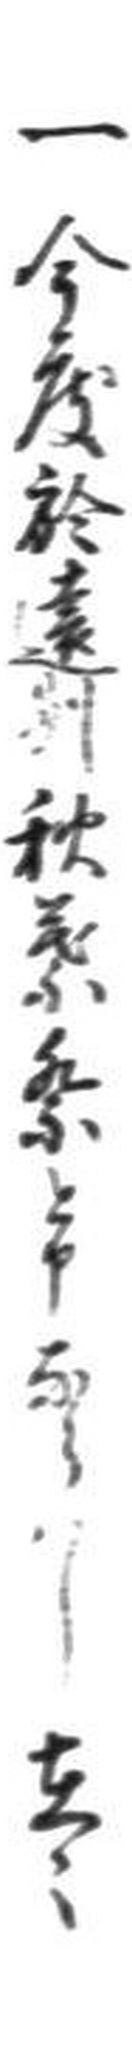一今度於遠州秋葉祭と申ならハし在々
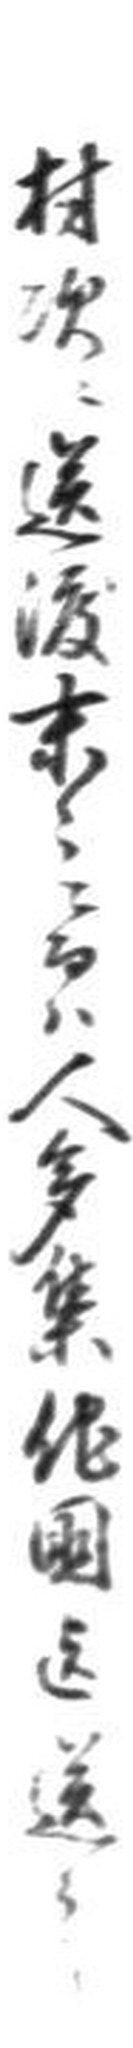村次ニ送渡末々に而ハ人多集他国迄送之
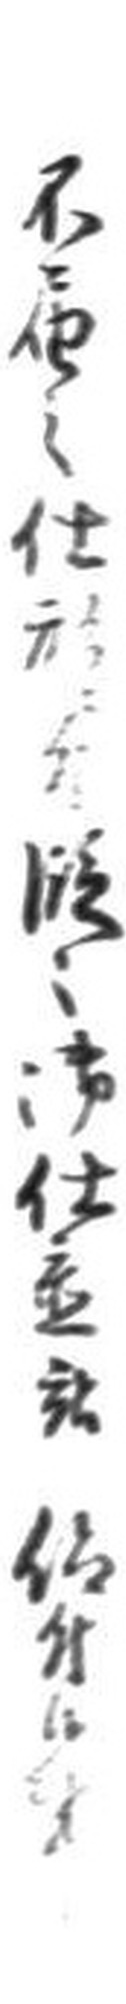不届之仕形ニ付段々御仕置被仰付候事
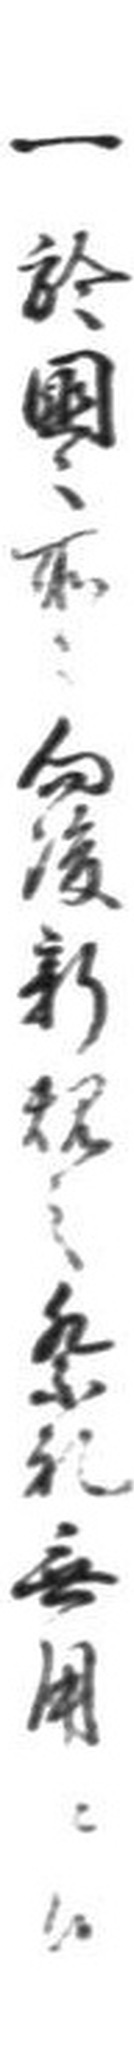一於国々所々向後新規之祭礼無用ニ候

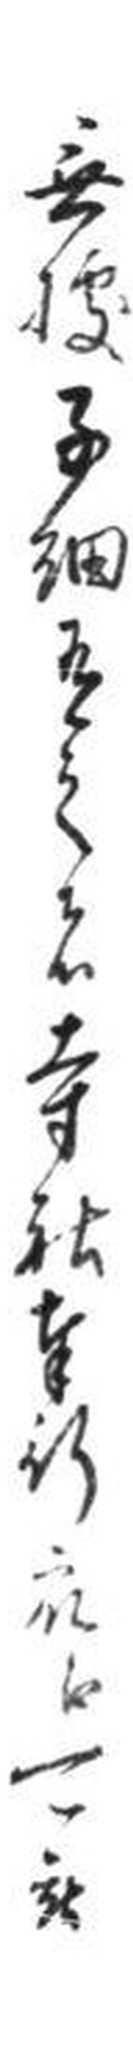無拠子細有之者寺社奉行衆江可被
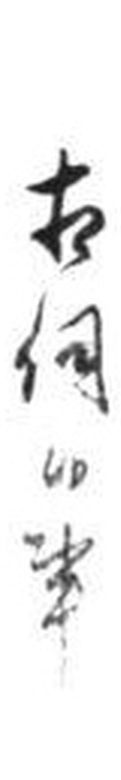相伺候事
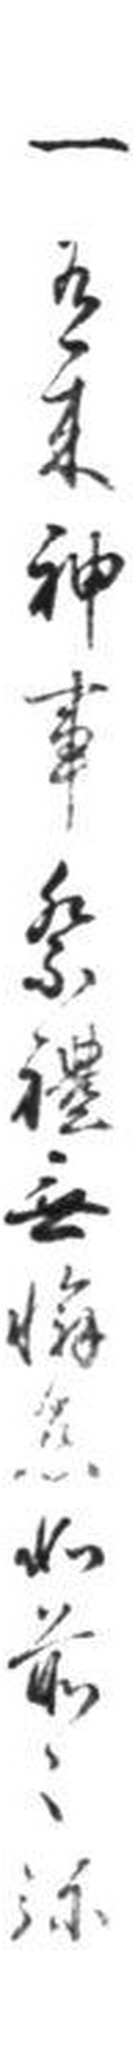一有来神事祭礼無懈怠如前々弥
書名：家譜 十五 綱昌公 従天和元年到元禄十二年
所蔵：福井県文書館 Fukui Prefectural Archives
